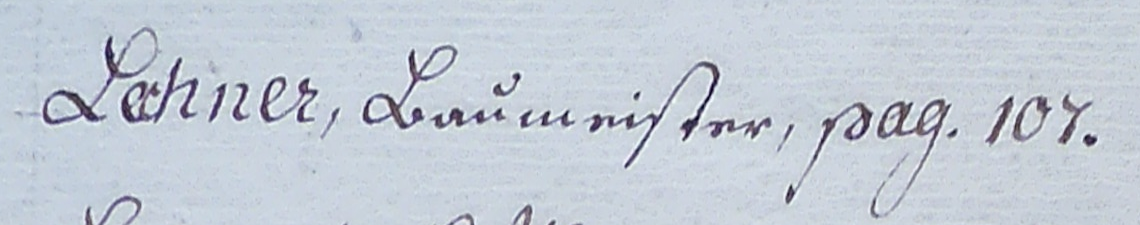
Lechner, Baumeister, pag. 107.
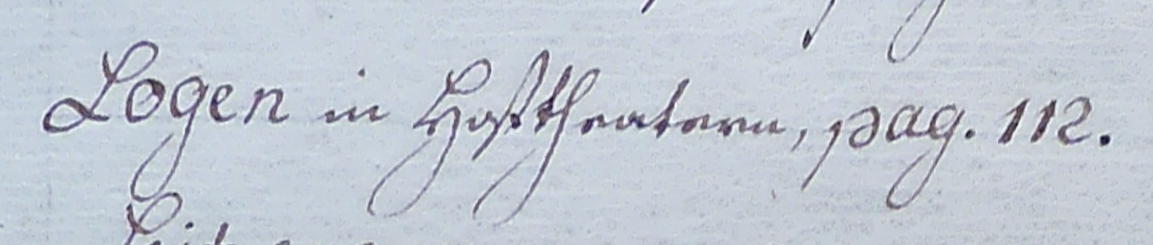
Logen in Hoftheatern, pag. 112.
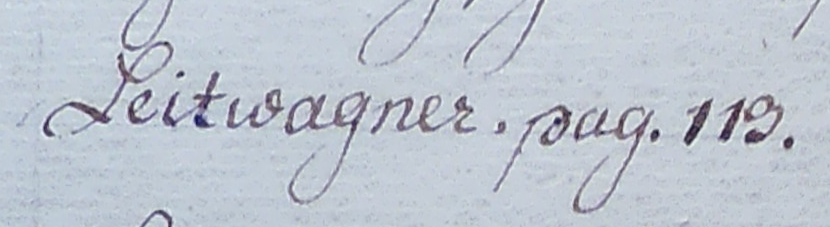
Leitwagner, pag. 113.
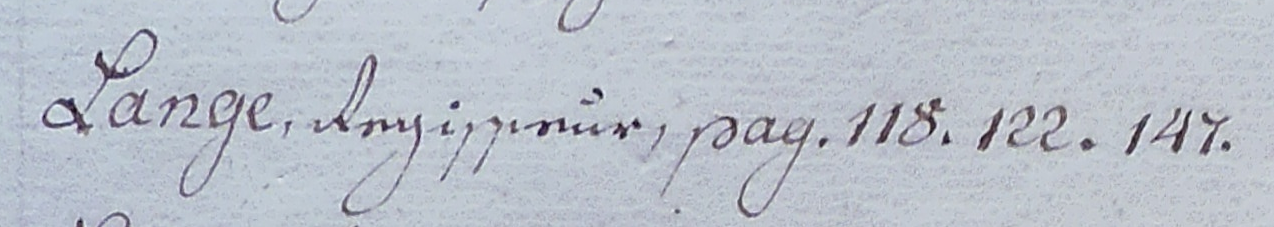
Lange, Regisseur, pag. 118. 122. 147.
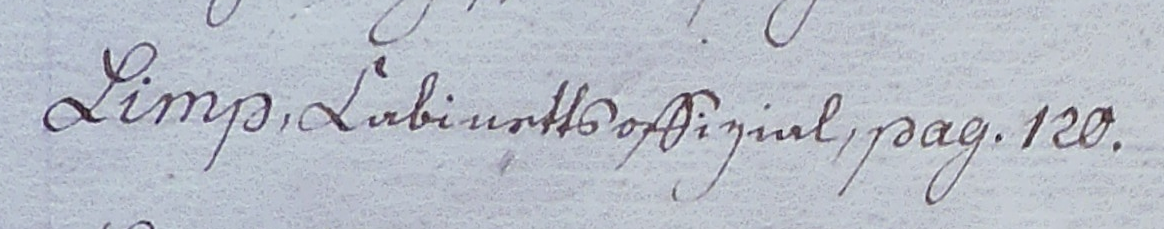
Limp, Cabinettsoffizial, pag. 120.
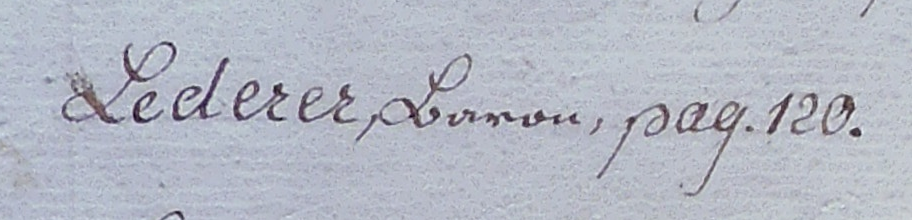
Lederer, Baron, pag. 120.
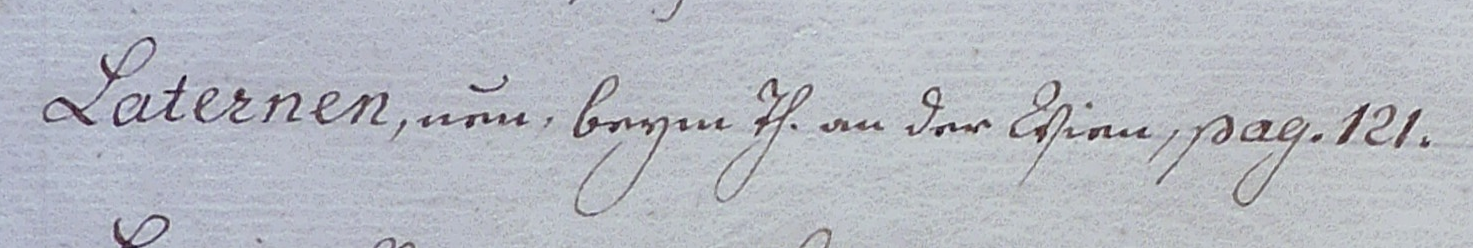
Laternen, neu, beym Th. an der Wien, pag. 121.
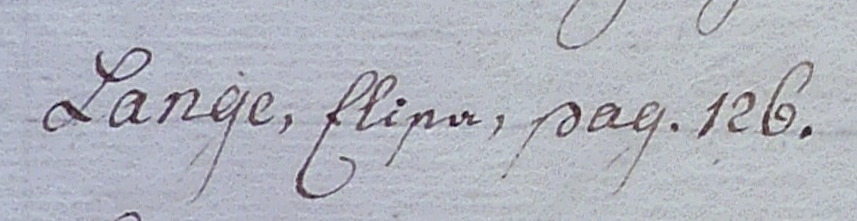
Lange, Elisa, pag. 126.
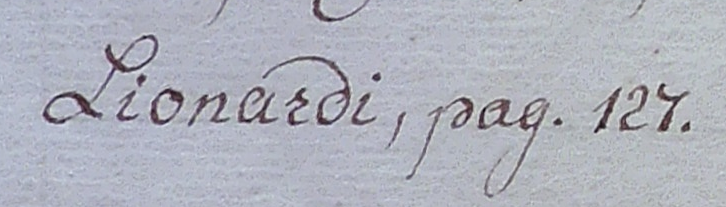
Lionardi, pag. 127.
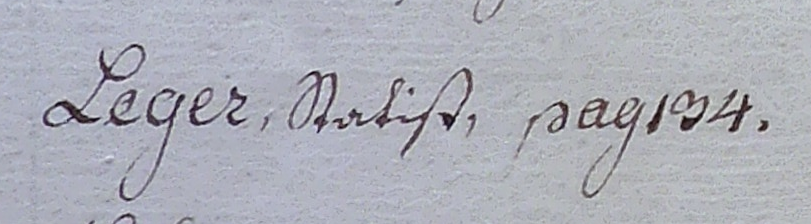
Leger, Statist, pag. 134.
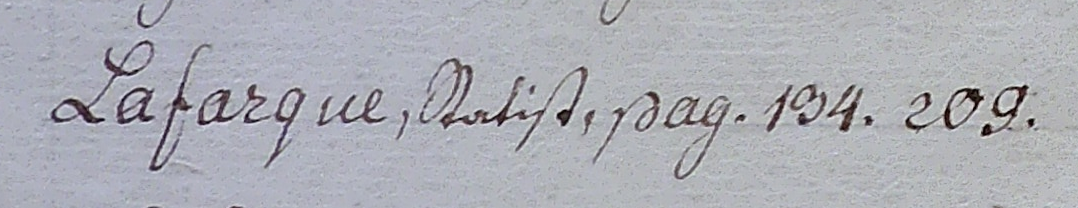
Lafarque, Statist, pag. 134. 209.
